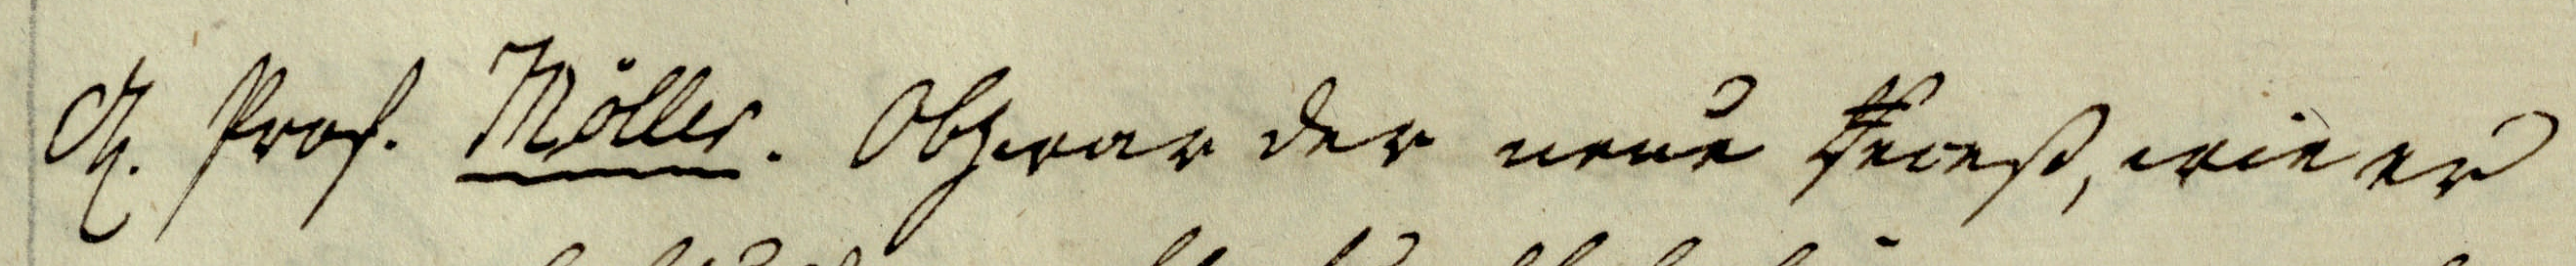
dh. Prof. Möller. Obzwar der neue Receß, wie er
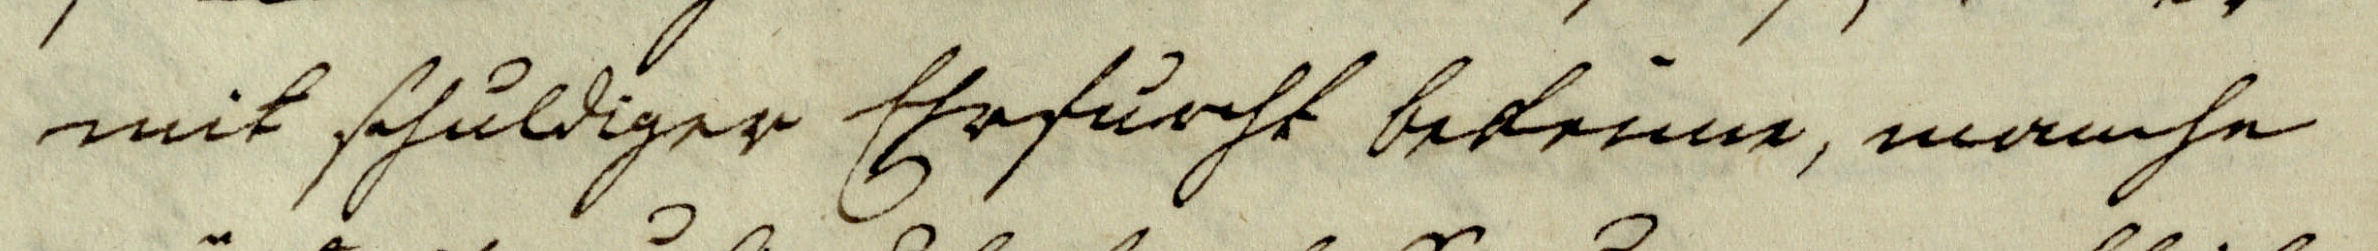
mit schuldiger Ehrfurcht bekenne, manche
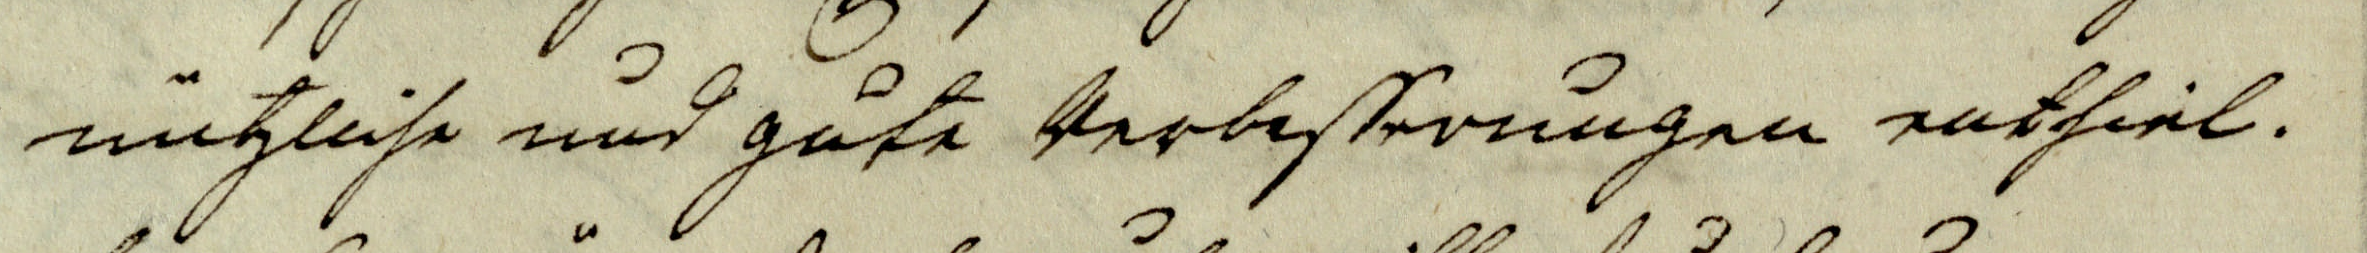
nützliche und gute Verbesserungen enthiel¬
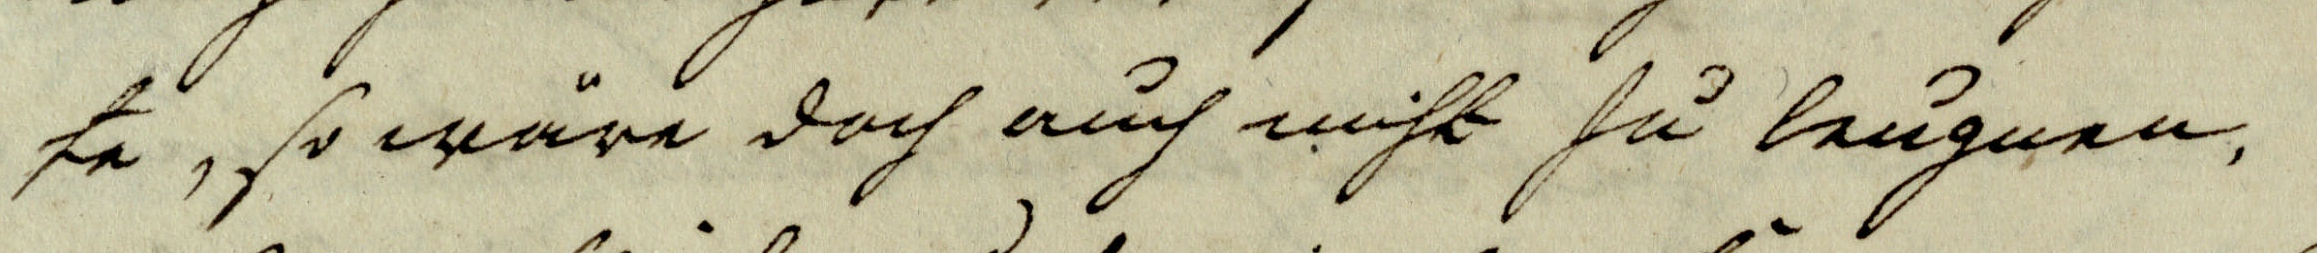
te, so wäre doch auch nicht zu leugnen,
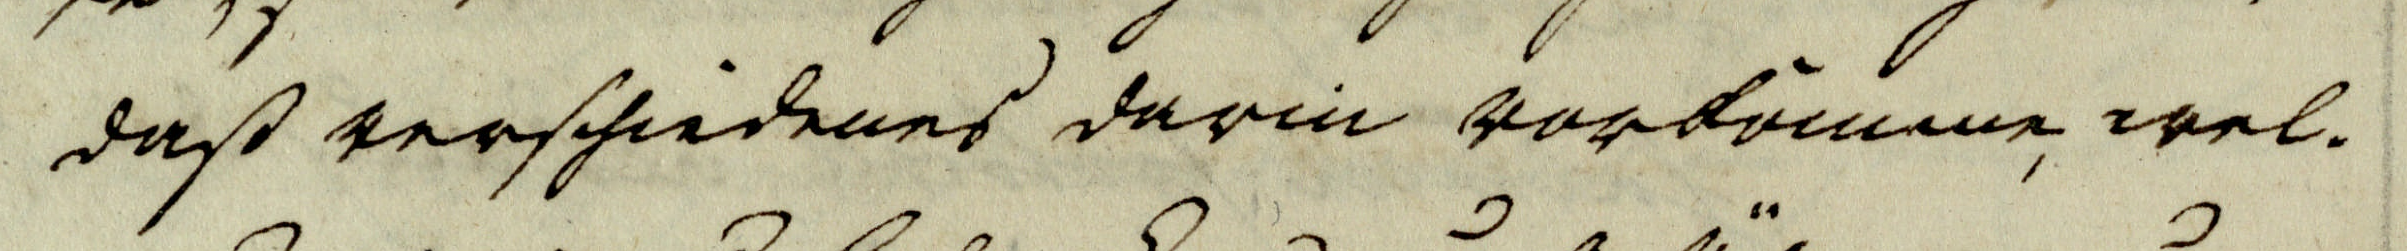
daß verschiedenes darin vorkomme, wel¬
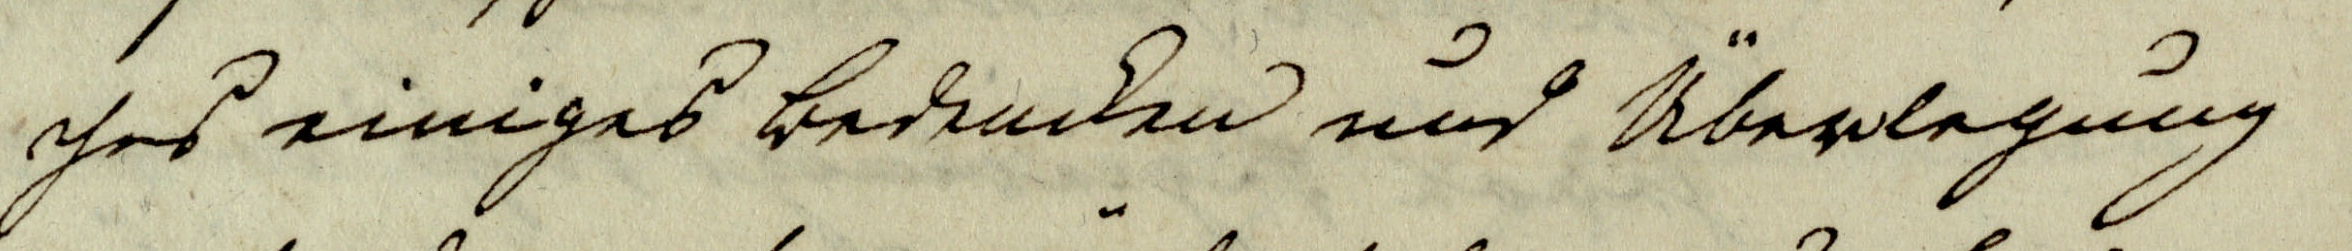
ches einiges Bedencken und Überlegung
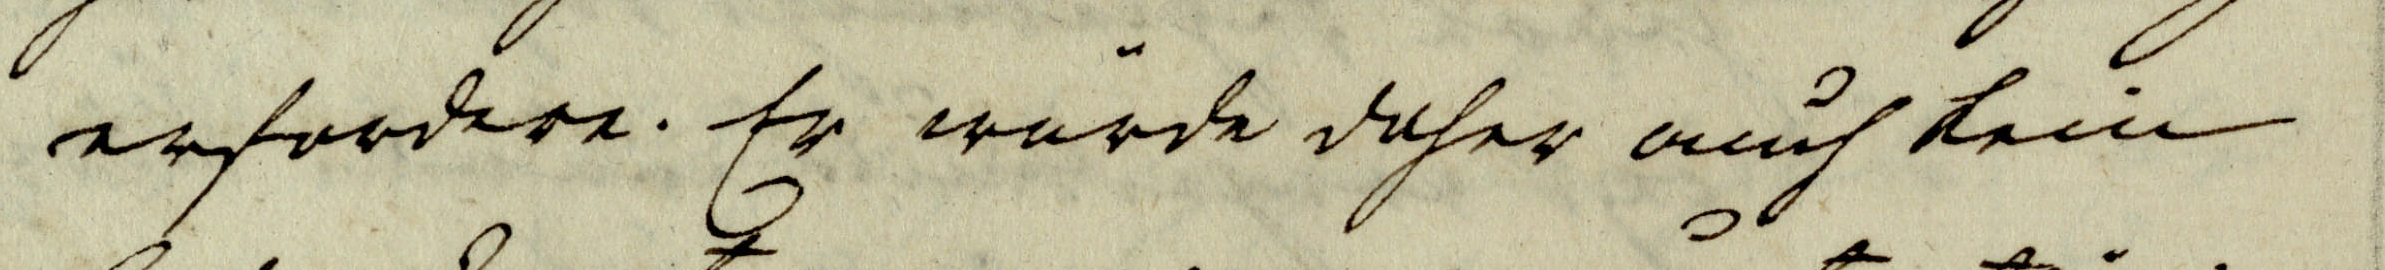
erfordere. Er würde daher auch kein
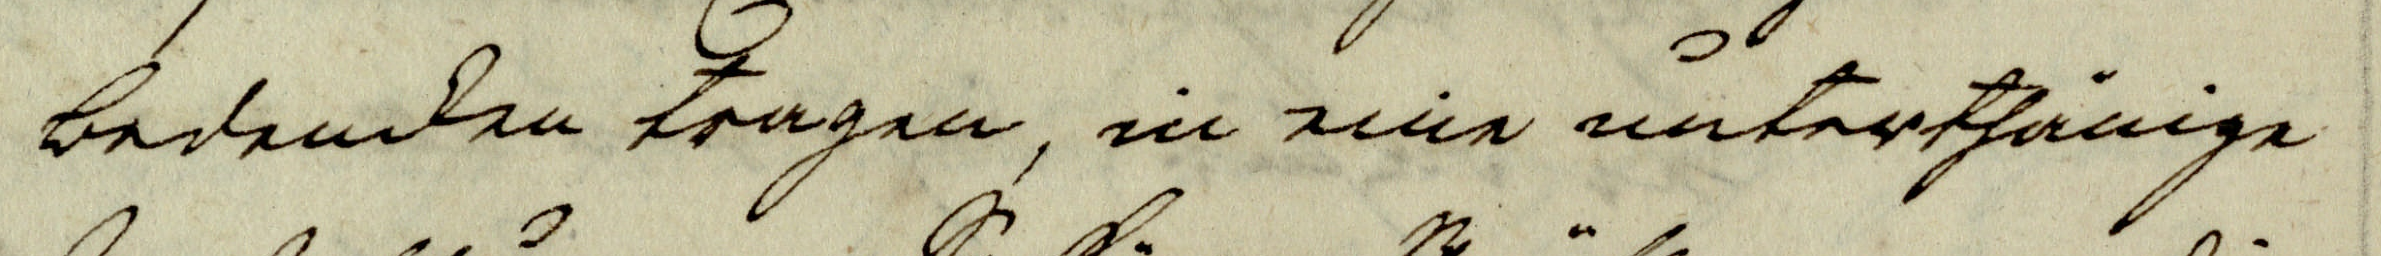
Bedencken tragen, in eine unterthänige
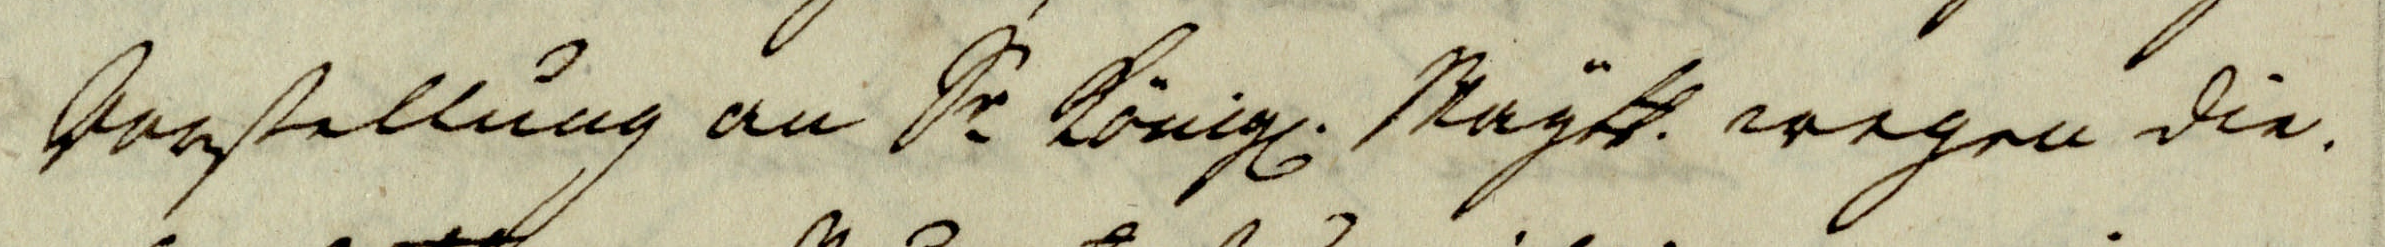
Vorstellung an Sr Königl. Maÿtt. wegen die¬
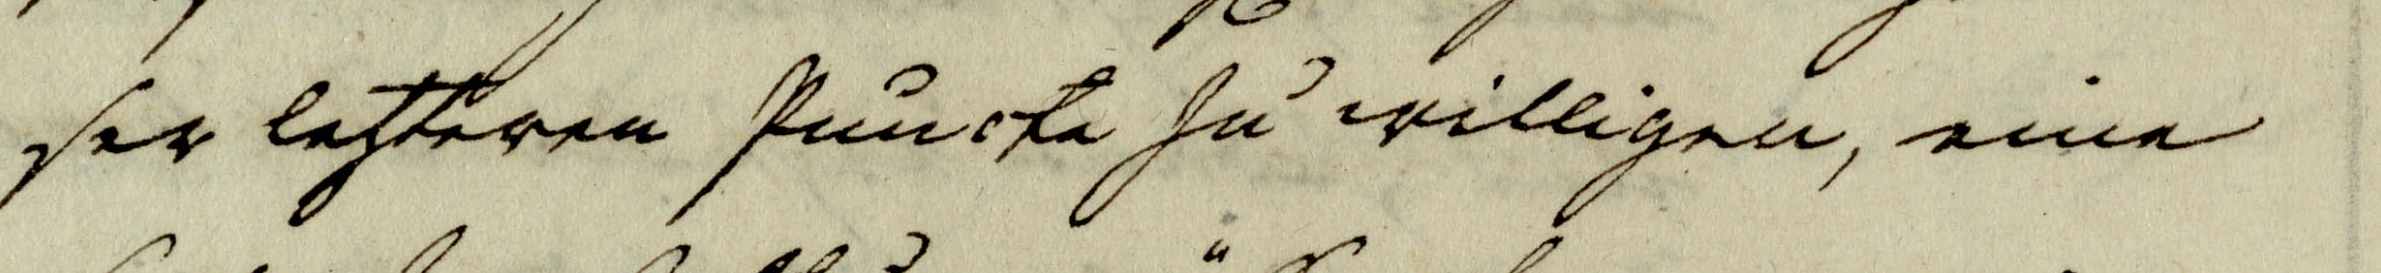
ser letzteren Puncte zu willigen, eine
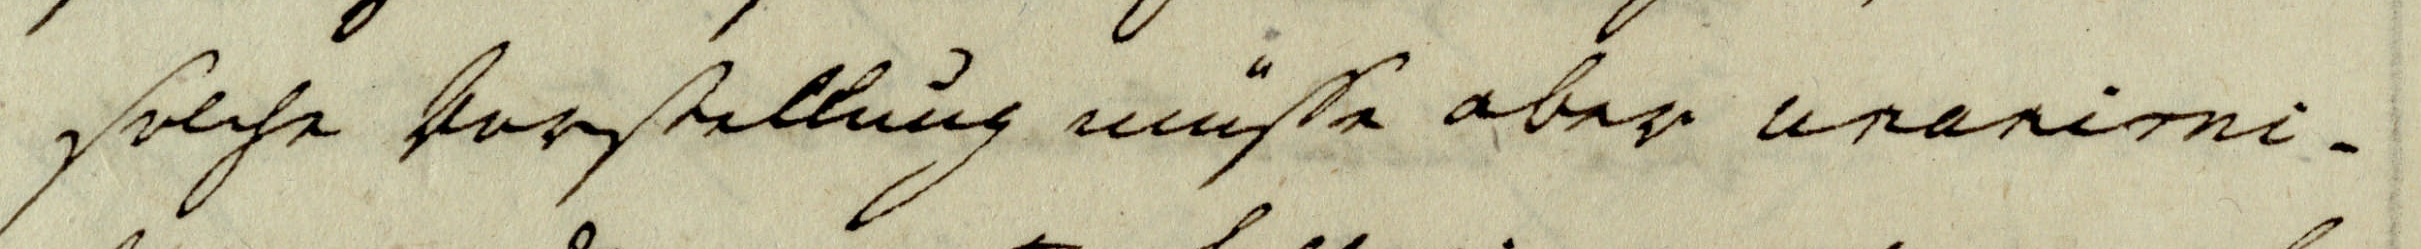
solche Vorstellung müsse aber unanimi-
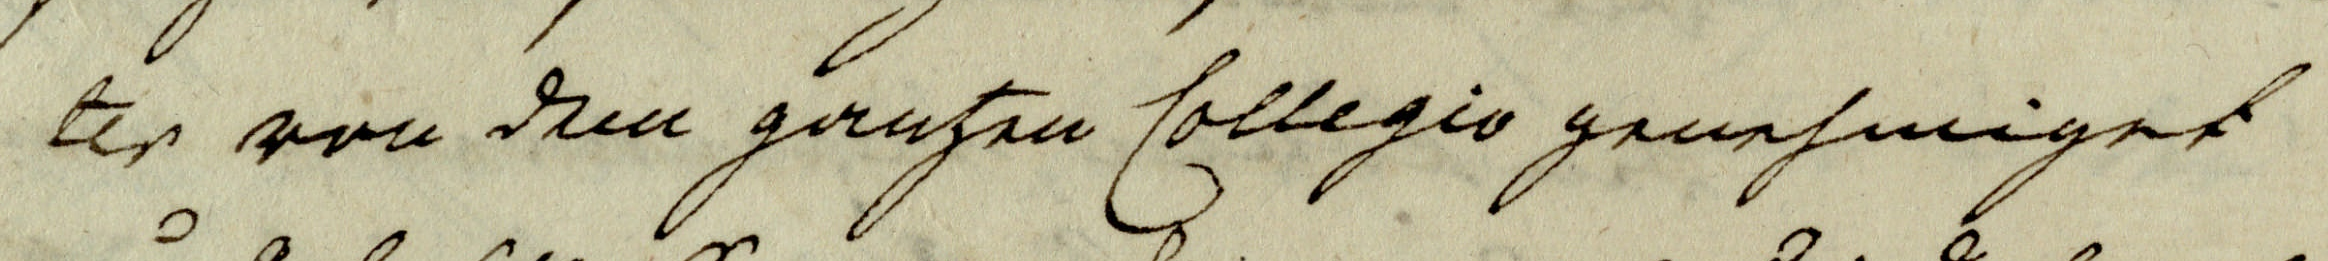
ter von dem ganzen Collegio genehmiget
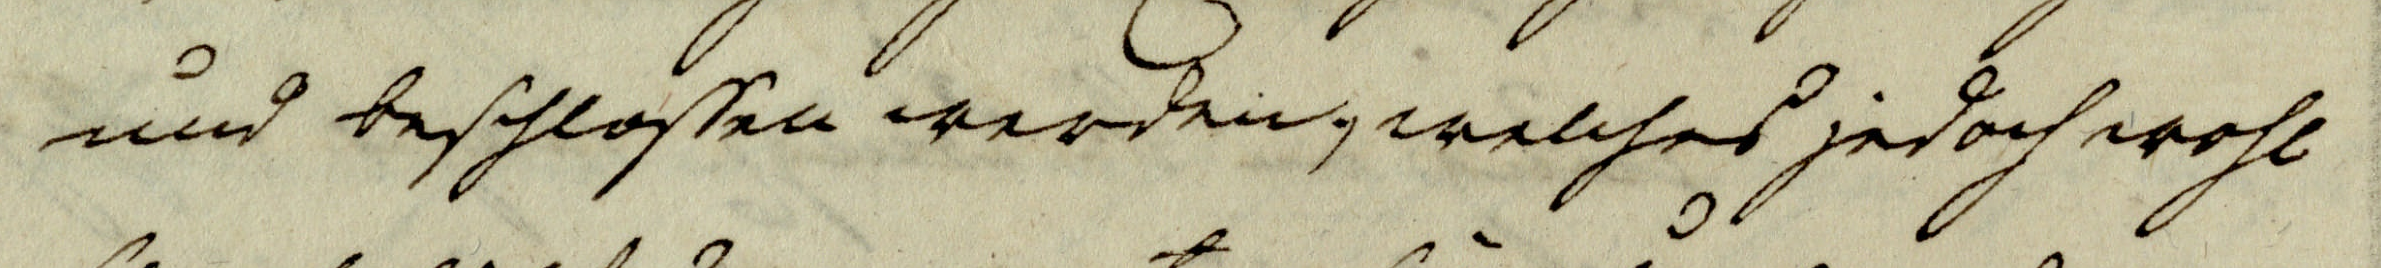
und beschlossen werden, welches jedoch wohl
